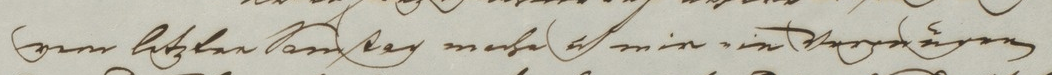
vom letzten Samstag mache ich mir ein Vergnügen
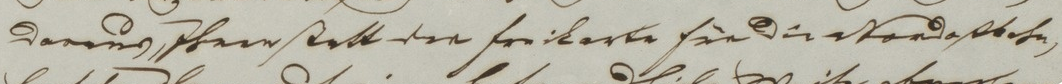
daraus, Ihnen statt der Freikarte für die Nordostbahn,
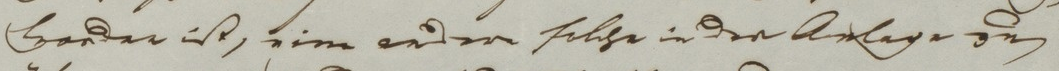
worden ist, eine andere solche in der Anlage zu
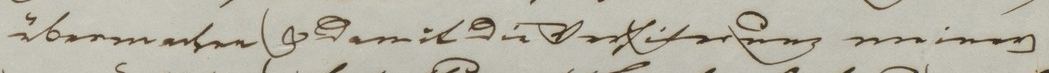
übermachen & damit die Versicherung meiner
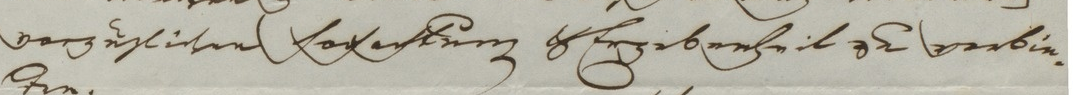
vorzüglichen Hochachtung & Ergebenheit zu verbin-
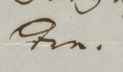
den.
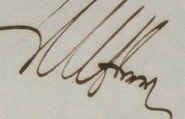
A Escher
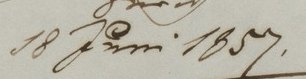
18 Juni 1857.
